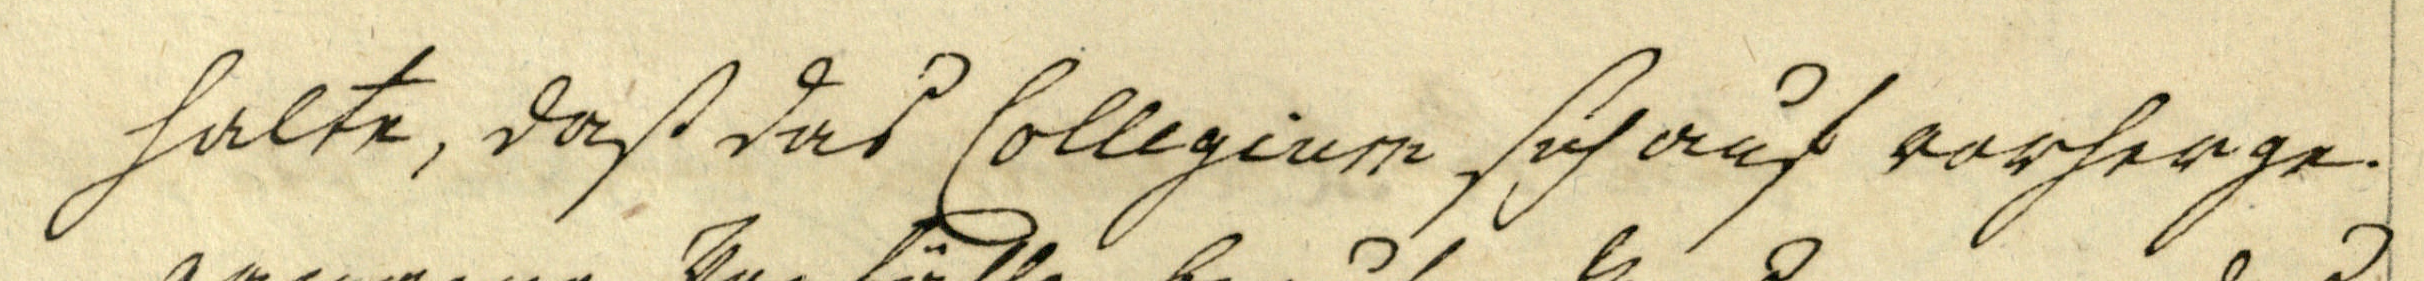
halte, daß das Collegium sich auf vorherge¬
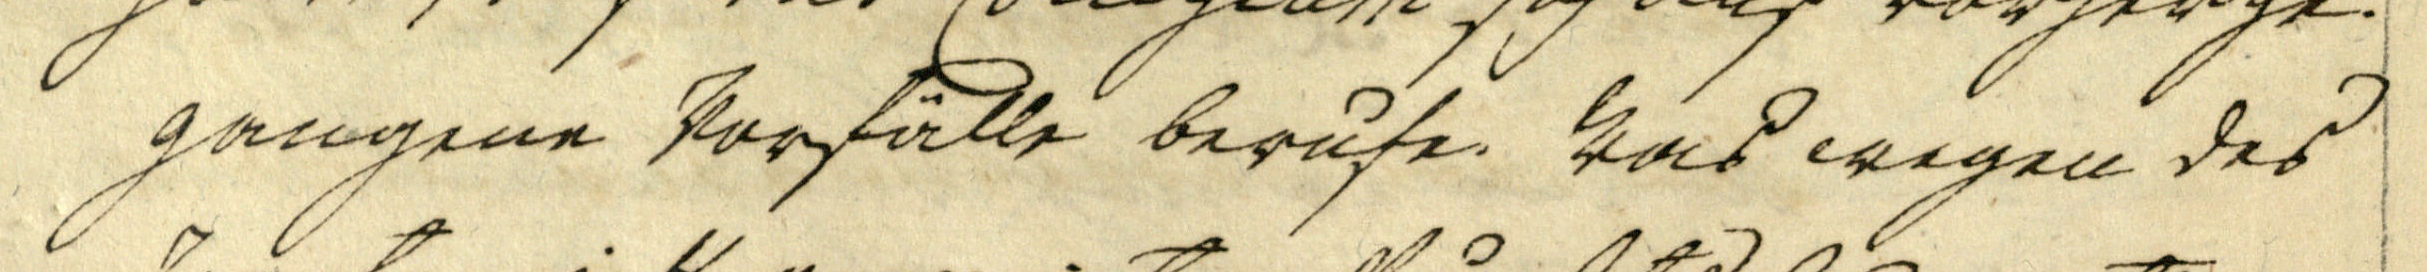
gangene Vorfälle berufe. Was wegen des
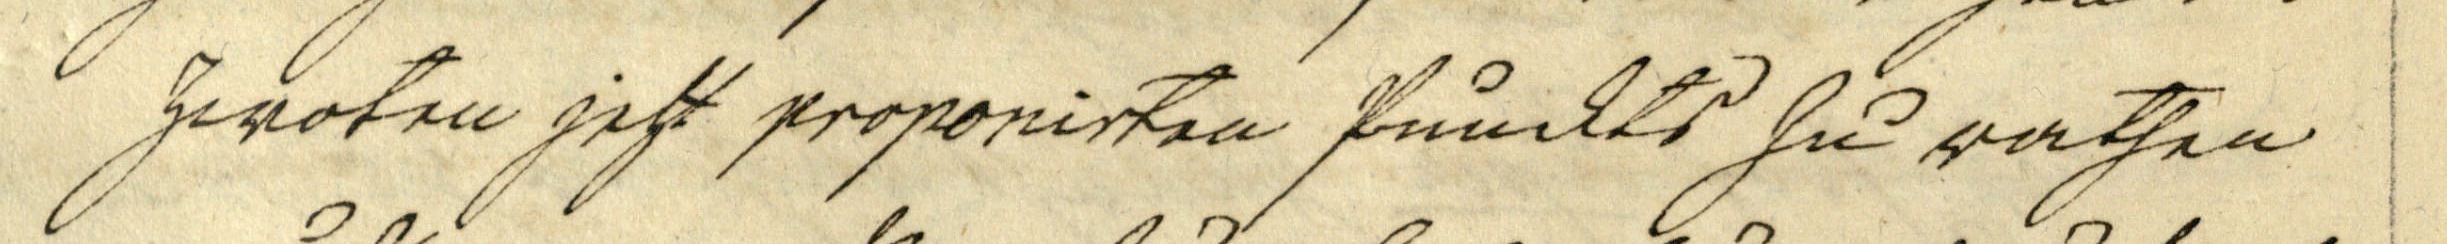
zwoten jetzt proponirten Punckts zu rathen
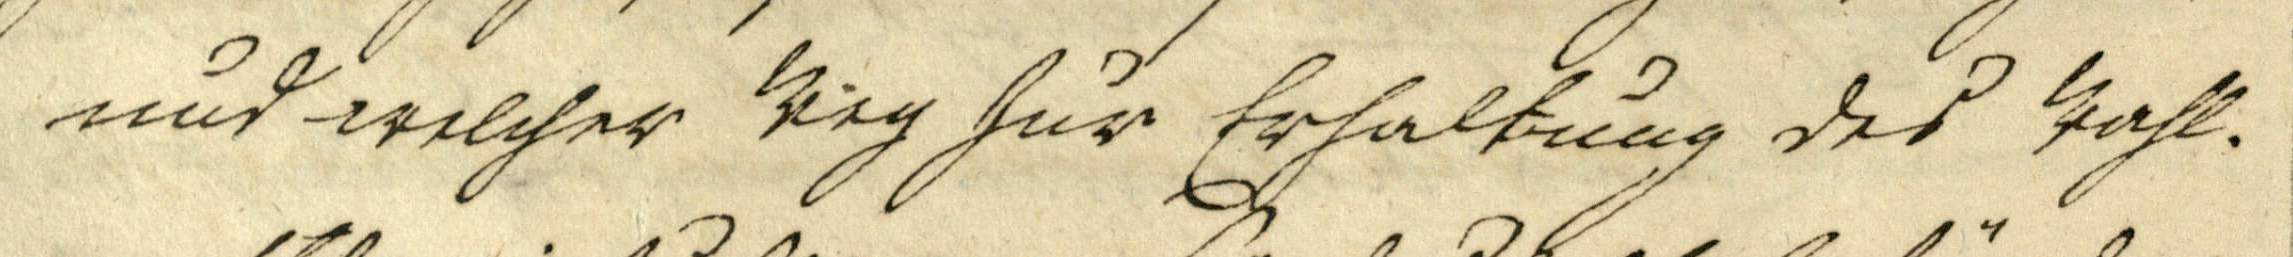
und welcher Weg zur Erhaltung des Wahl¬
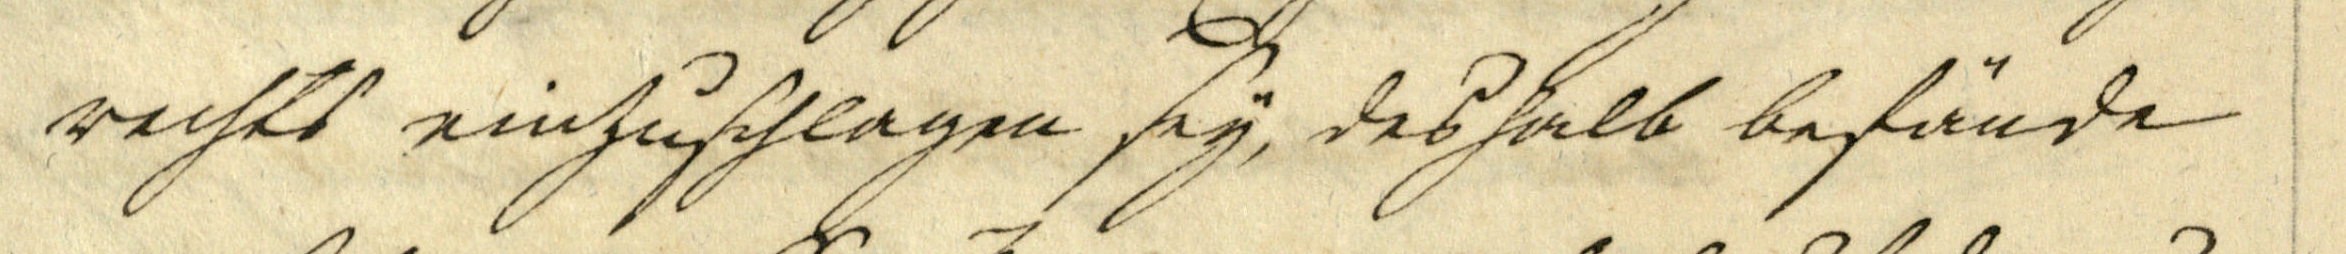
rechts einzuschlagen seÿ, deshalb befände
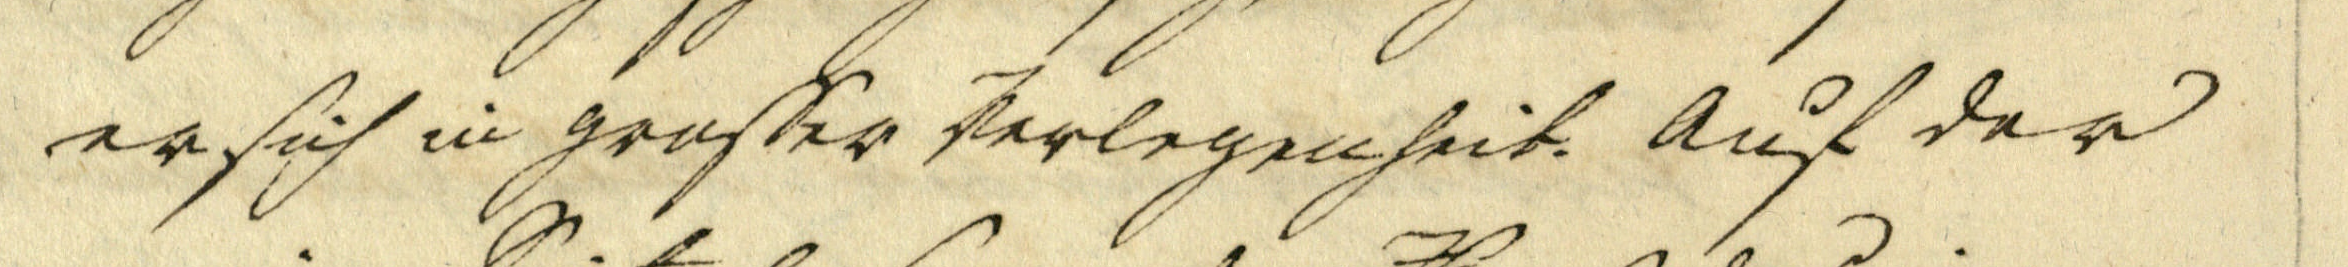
er sich in grosser Verlegenheit auf der
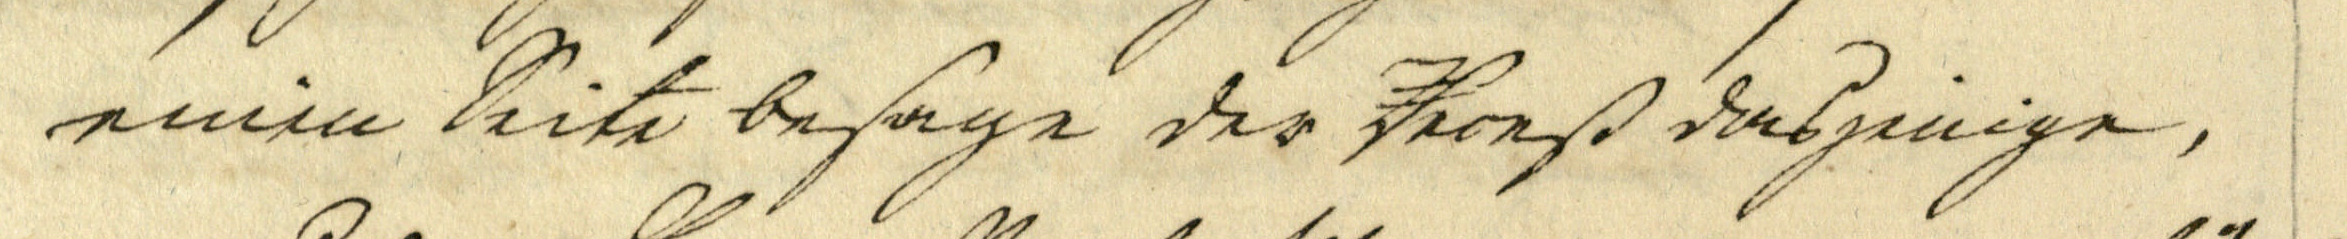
einen Seite besage der Receß dasjenige,
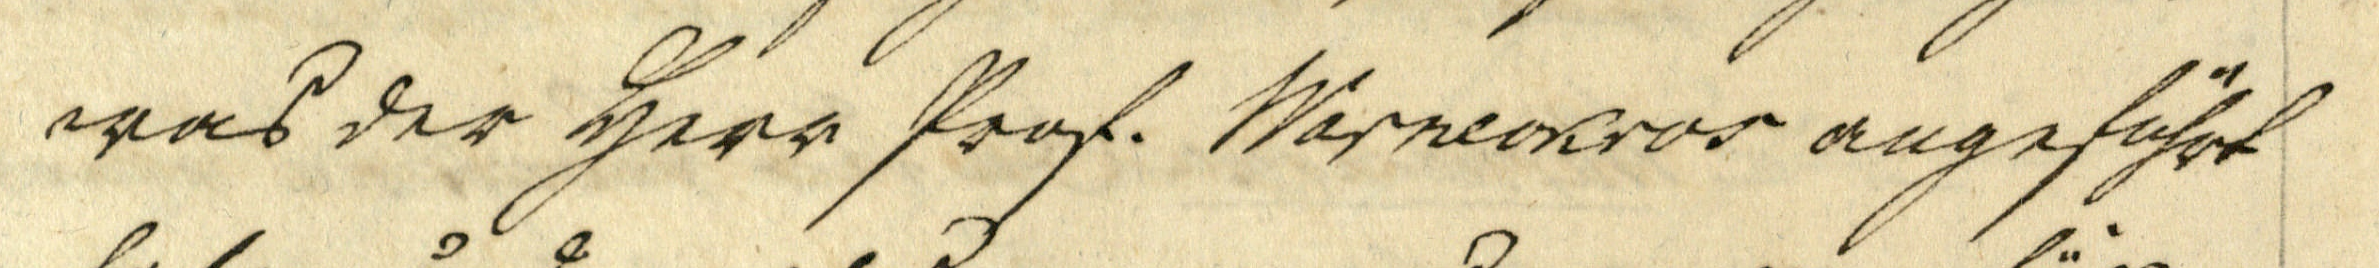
was der Herr Prof. Warneckros angeführt
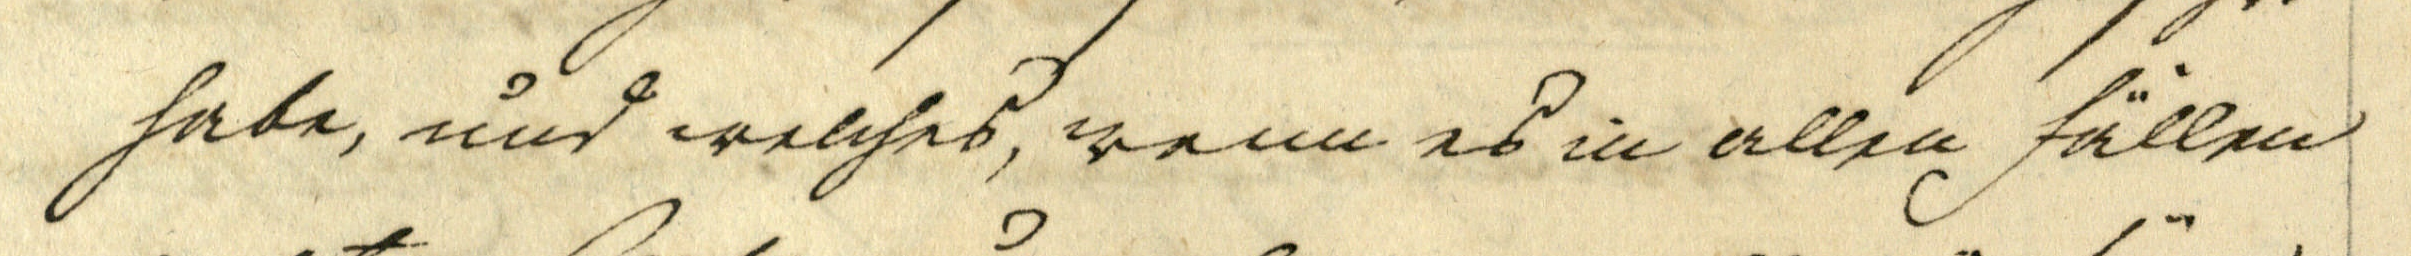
habe, und welches, wenn es in allen Fällen
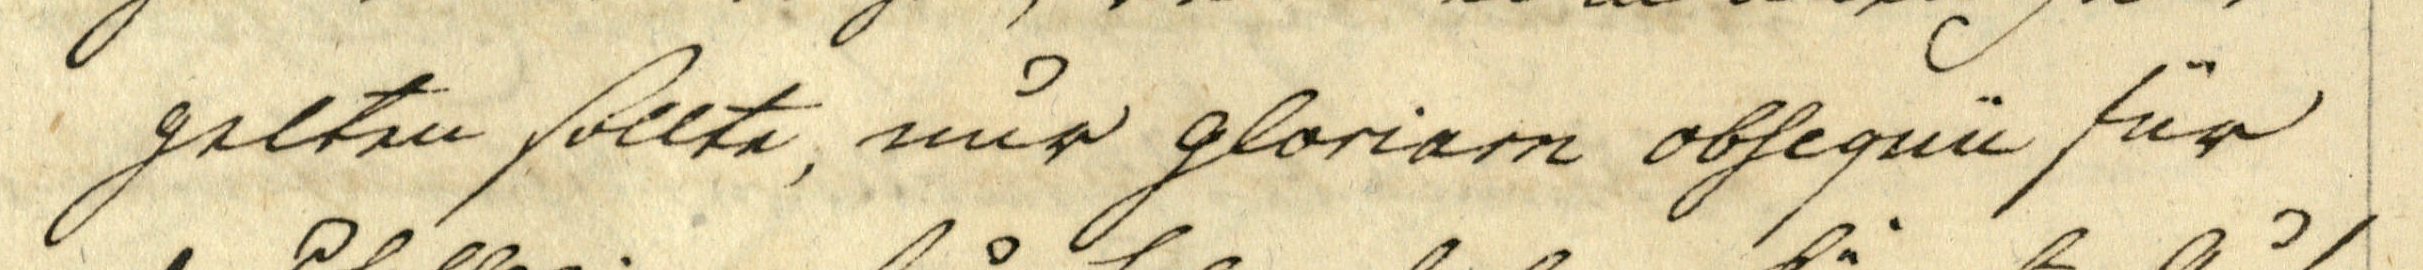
gelten sollte, nur gloriam obsequii für
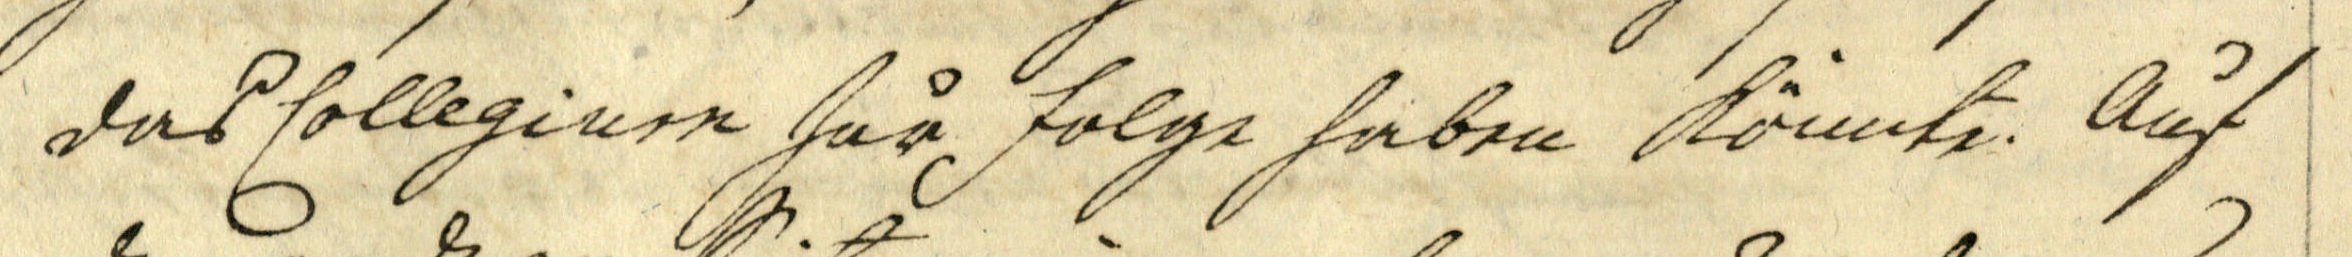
das Collegium zur Folge haben könnte. Auf
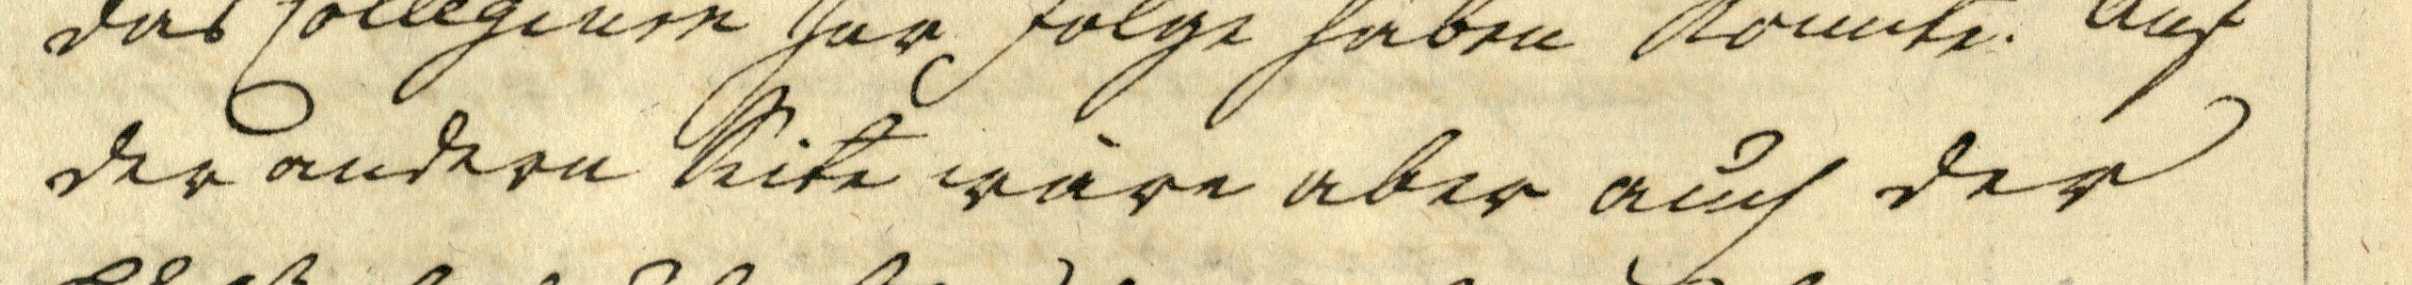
der andern Seite wäre aber auch der
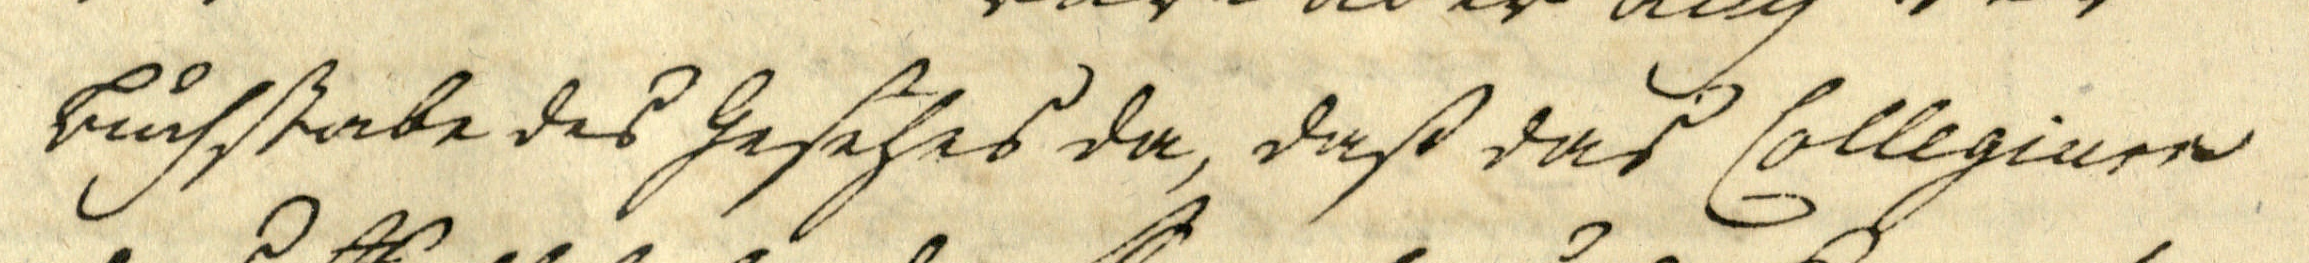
Buchstabe des Gesetzes da, daß das Collegium
